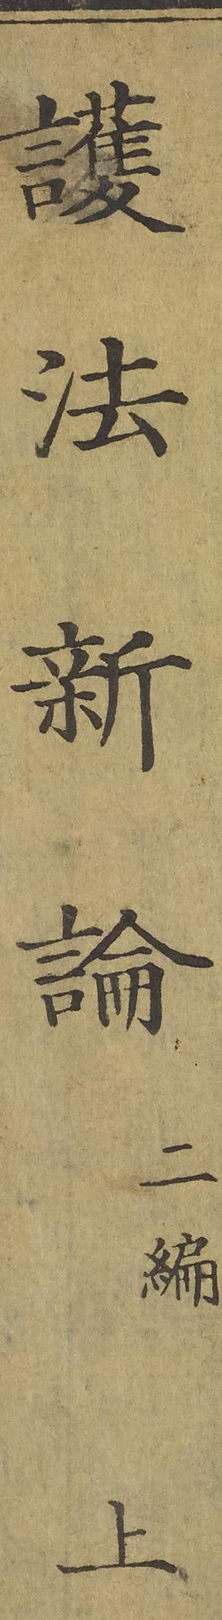護法新論二編上

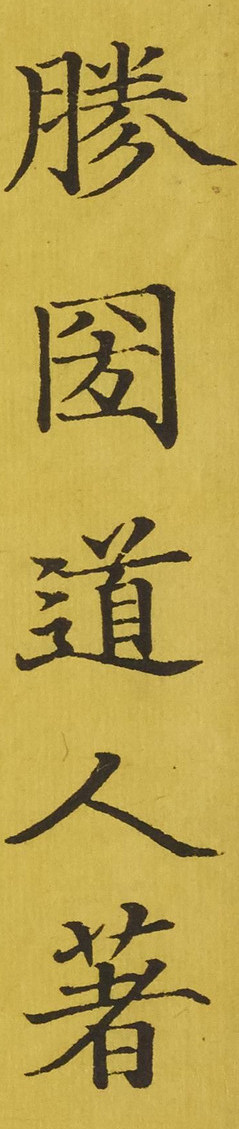勝国道人著
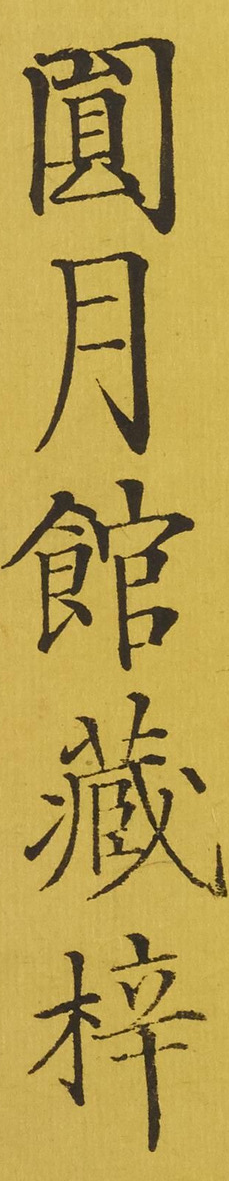円月館蔵梓
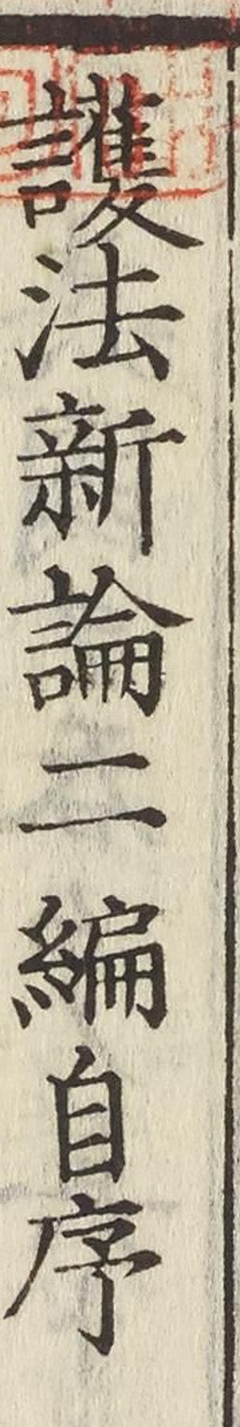護法新論ニ編自序
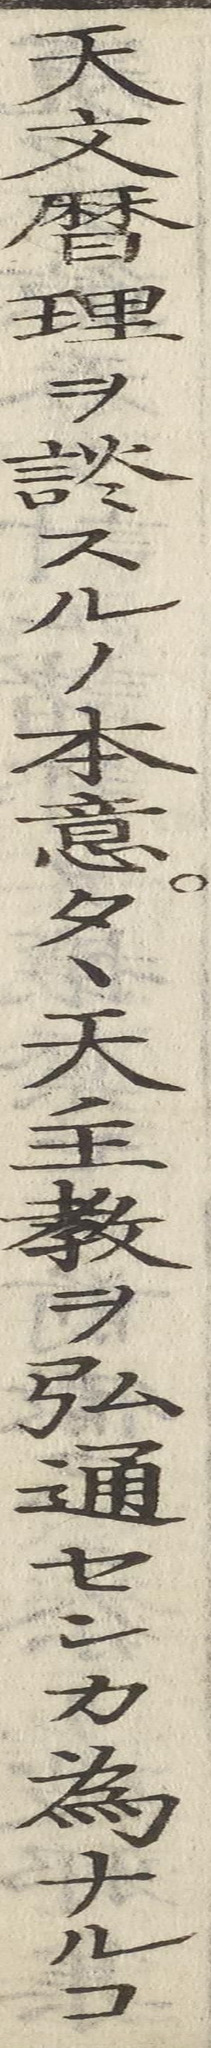天文暦理ヲ談スルノ本意。タヽ天主教ヲ弘通センカ為ナルコ
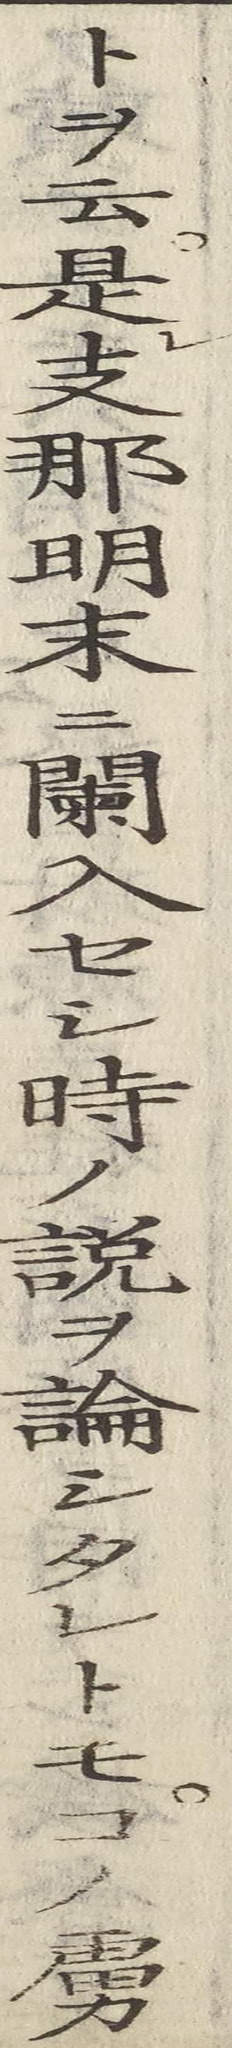トヲ云。是支那明末ニ闌入セシ時ノ説ヲ論シタレトモ。コノ虜

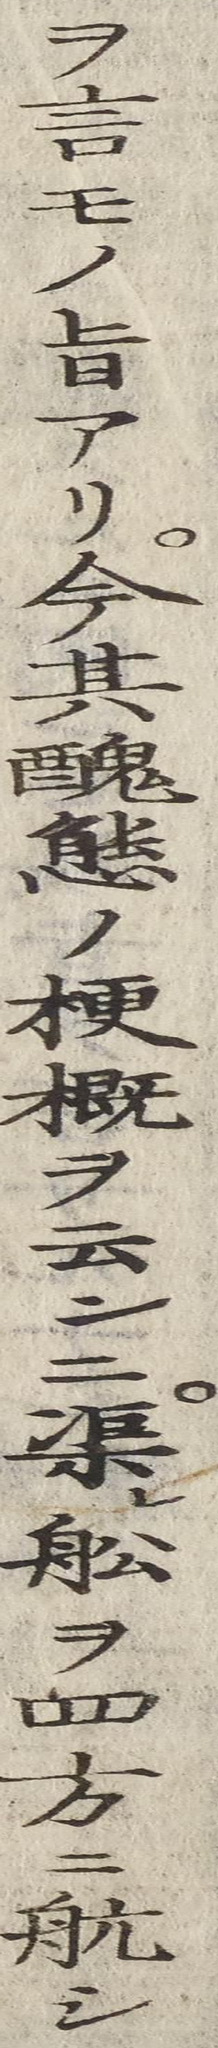ヲ言モノ旨アリ。今其醜態ノ梗概ヲ云ンニ。渠船ヲ四方ニ航シ
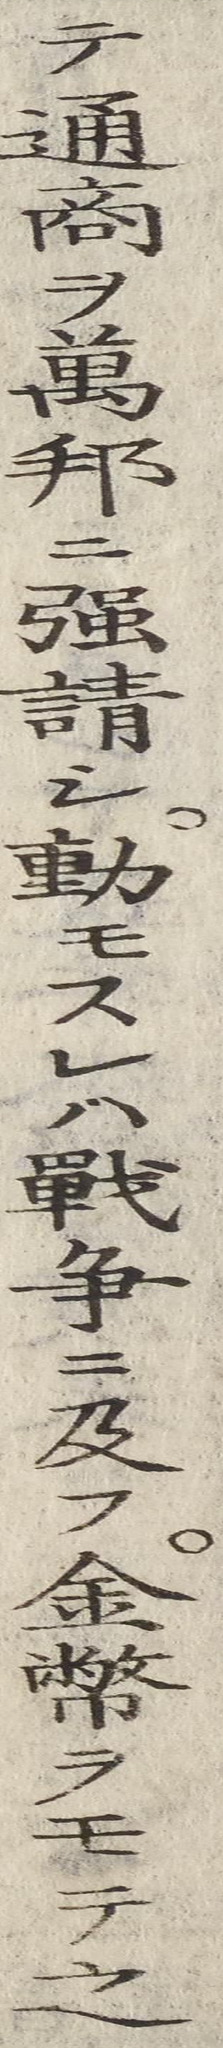テ通商ヲ万邦ニ強請シ。動モスレハ戦争ニ及フ。金幣ヲモテ之
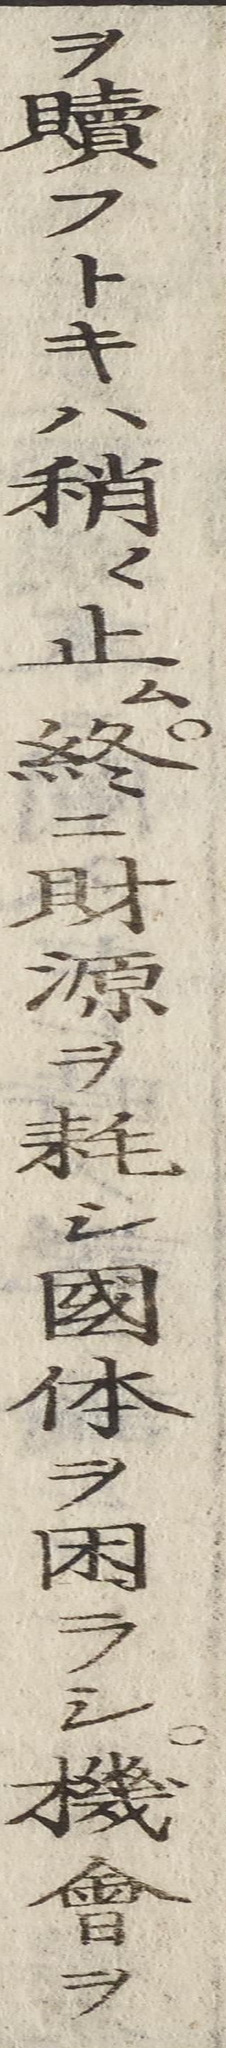ヲ贖フトキハ稍〱止。終ニ財源ヲ耗シ国体ヲ困ラシ。機会ヲ
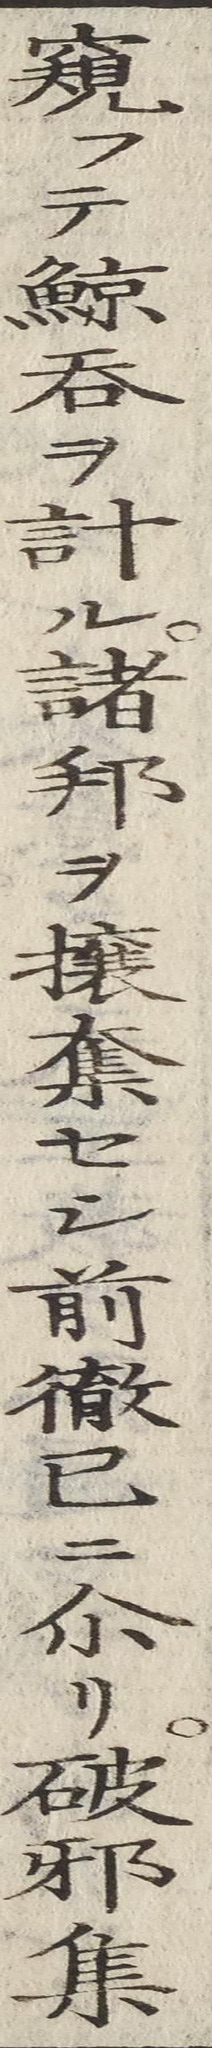窺フテ鯨呑ヲ計ル。諸邦ヲ攘奪セシ前徹已ニ尒リ。破邪集
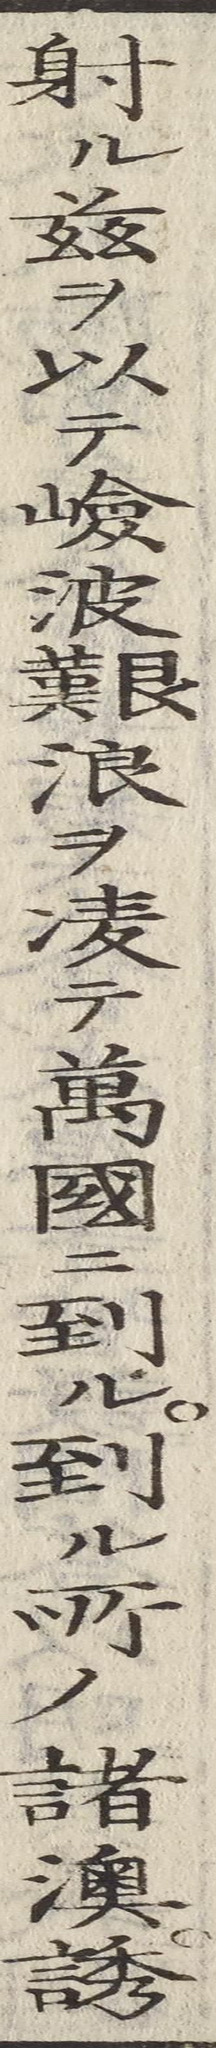射ル茲ヲ以テ嶮浪艱浪ヲ凌テ万国ニ到ル。到ル所ノ諸澳。誘
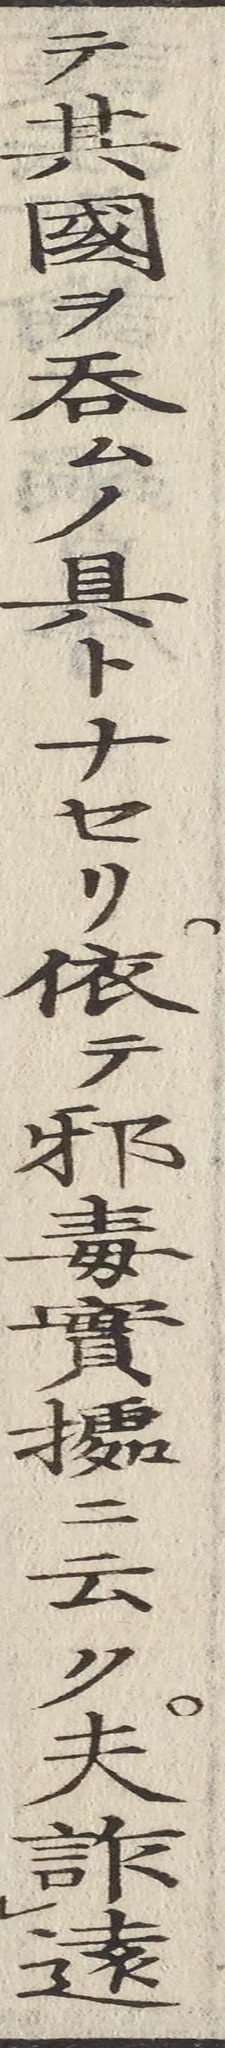テ其国ヲ呑ムノ具トナセリ。依テ邪毒実拠ニ云ク。夫詐遠
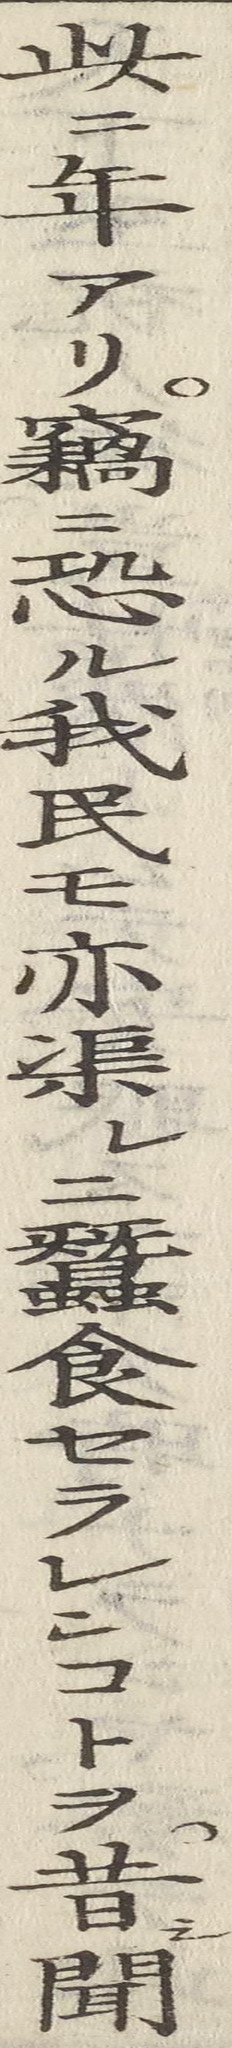此ニ年アリ。竊ニ恐ル我民モ亦渠レニ蠶食セラレンコトヲ。昔聞
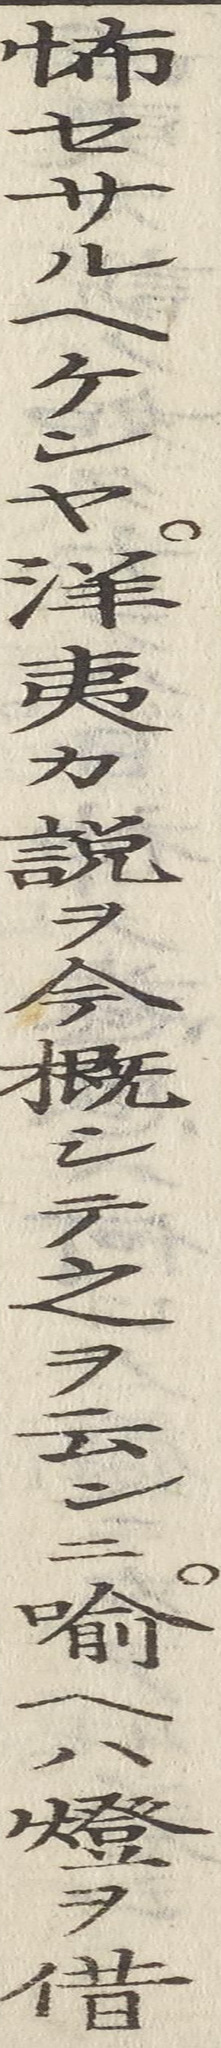怖セサルヘケンヤ。洋夷カ説ヲ今概シテ之ヲ云ンニ。喩ヘハ燈ヲ借
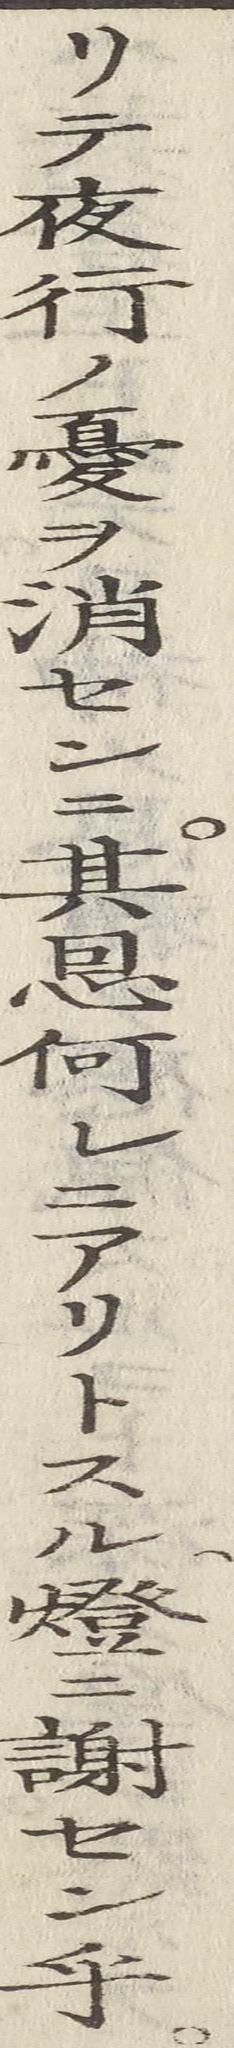リテ夜行ノ憂ヲ消センニ。其恩何レニアリトスル。燈ニ謝セン乎。
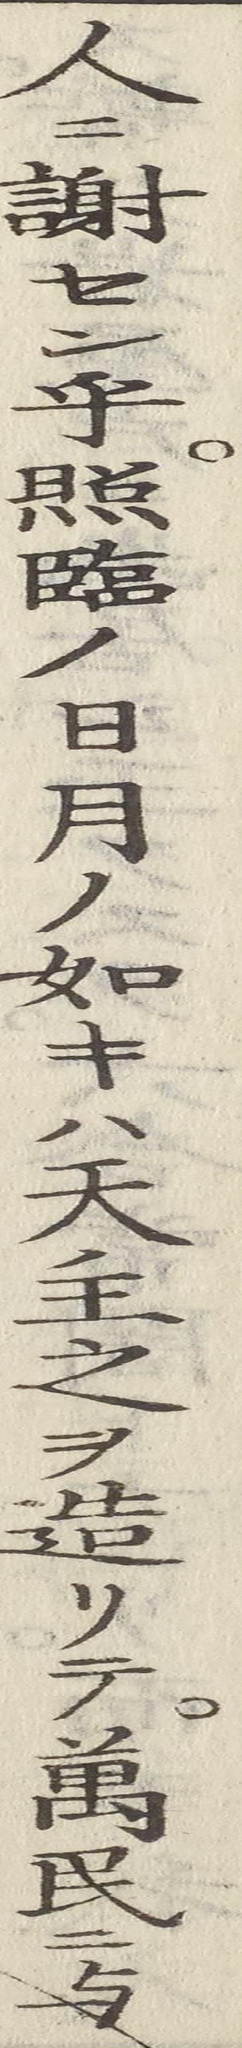人ニ謝セン乎。照臨ノ日月ノ如キハ天主之ヲ造リテ。万民ニ与
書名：護法新論　二編　上
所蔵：東京大学地震研究所図書室 Earthquake Research Institute Library, The University of Tokyo, JAPAN
